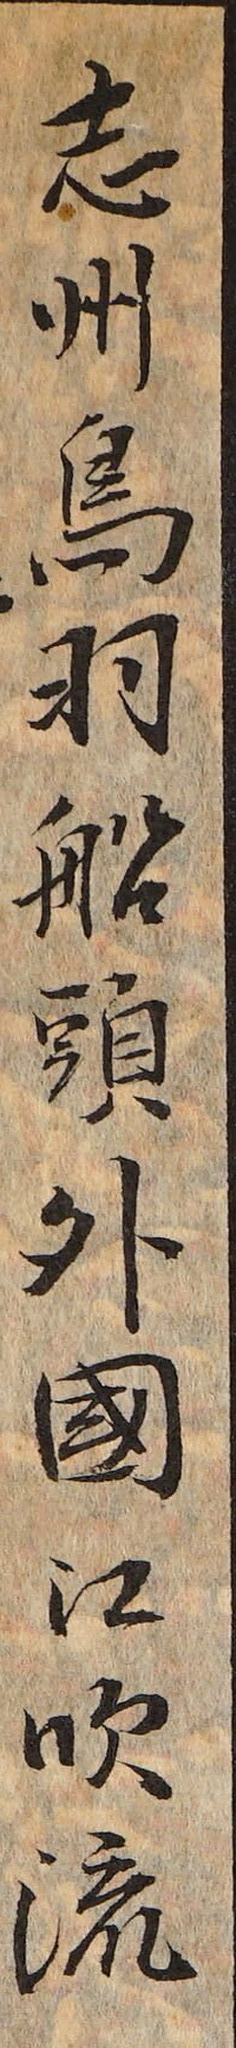志州鳥羽船頭外国江吹流
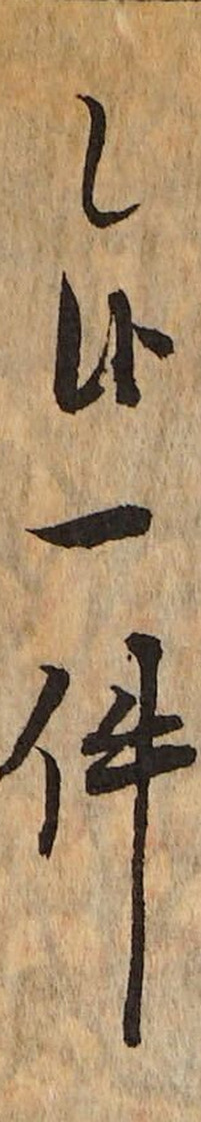し候一件

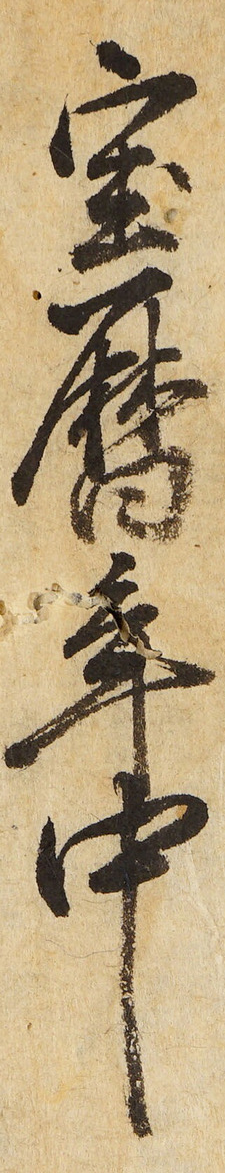宝暦年中
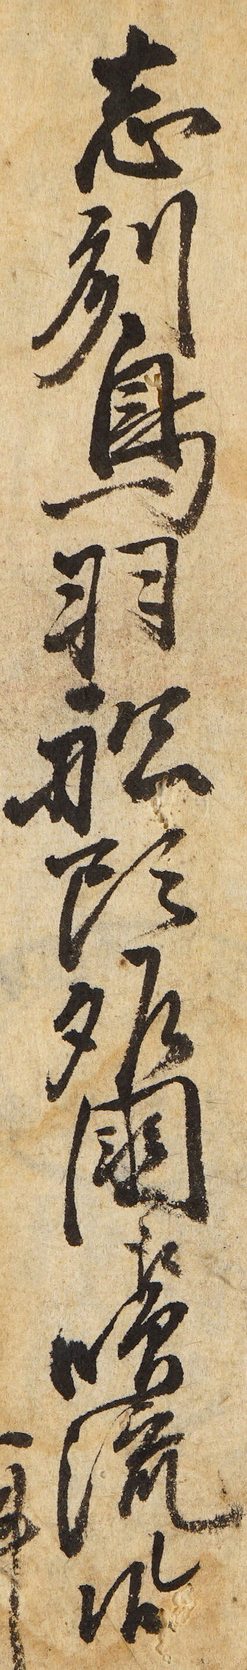志州鳥羽船頭外国江吹流し候一件

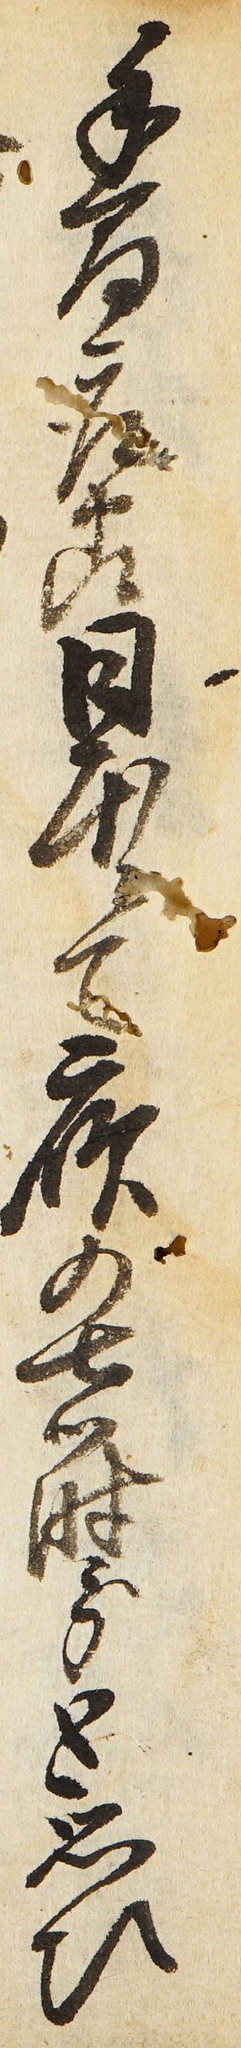手間取申候日本ニて夜の七ツ時分と思ひ
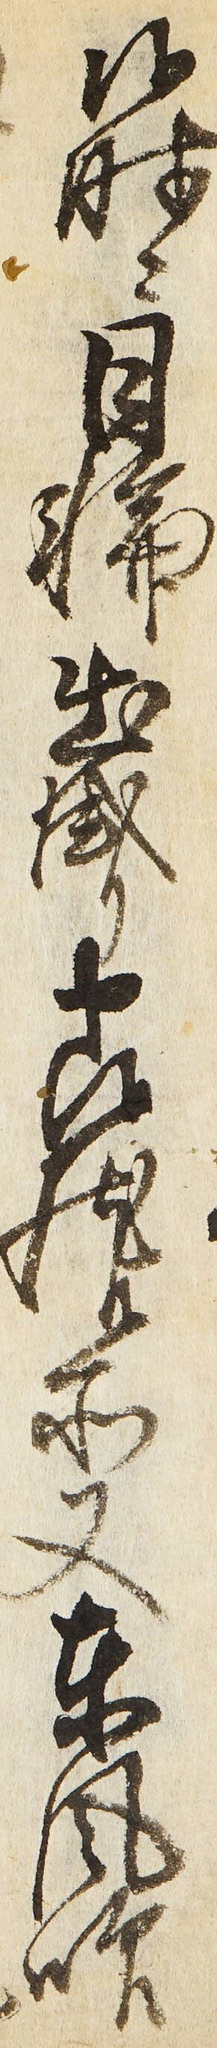候時ニ日輪出掛り申候然ル所又東風吹
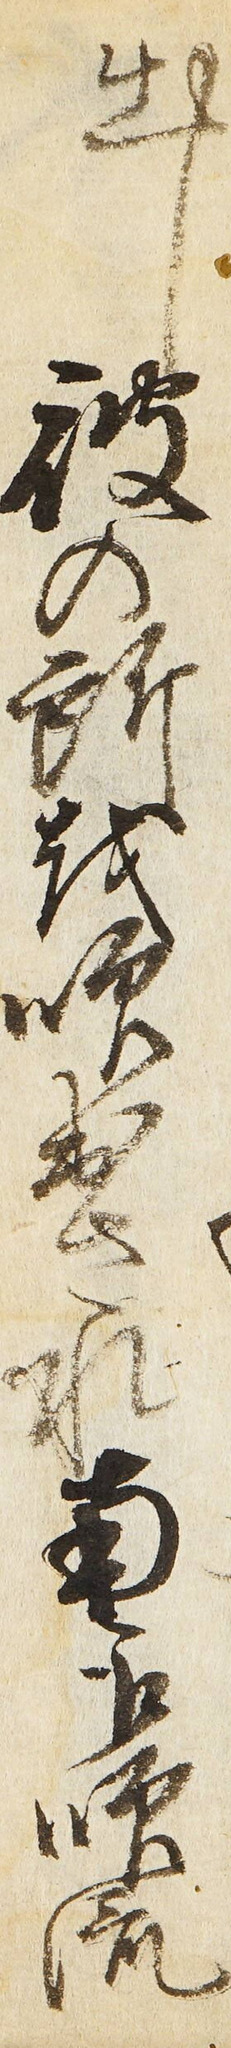出し彼の所を吹出され南江吹流
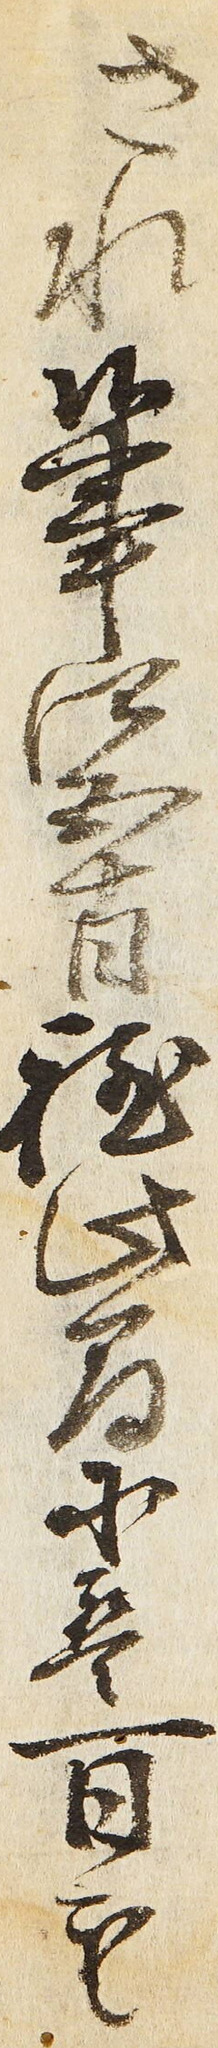され候事四五十日程此間には一日も
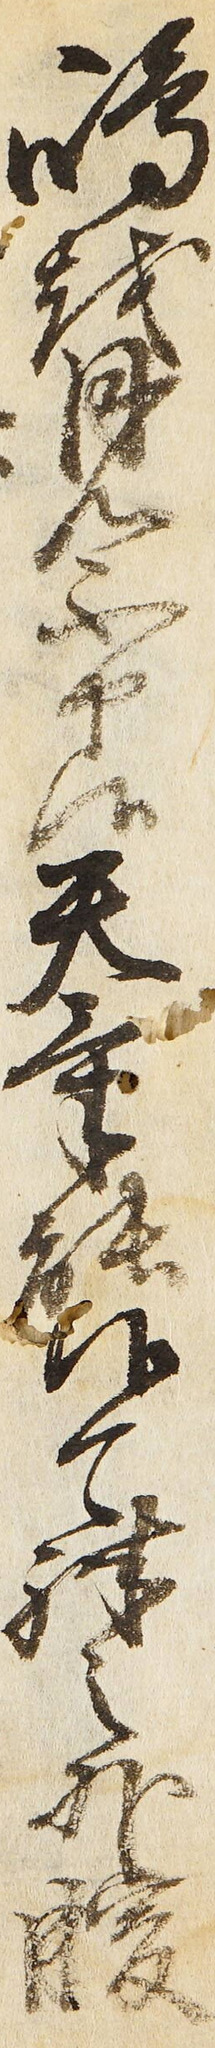島を見不申候天気能候て殊之外暖
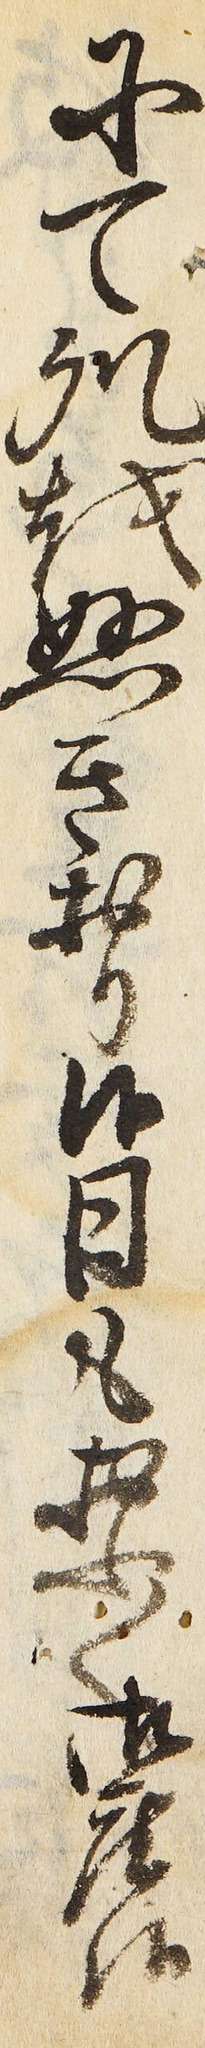にて肌をぬきおり候日もおふく御座候
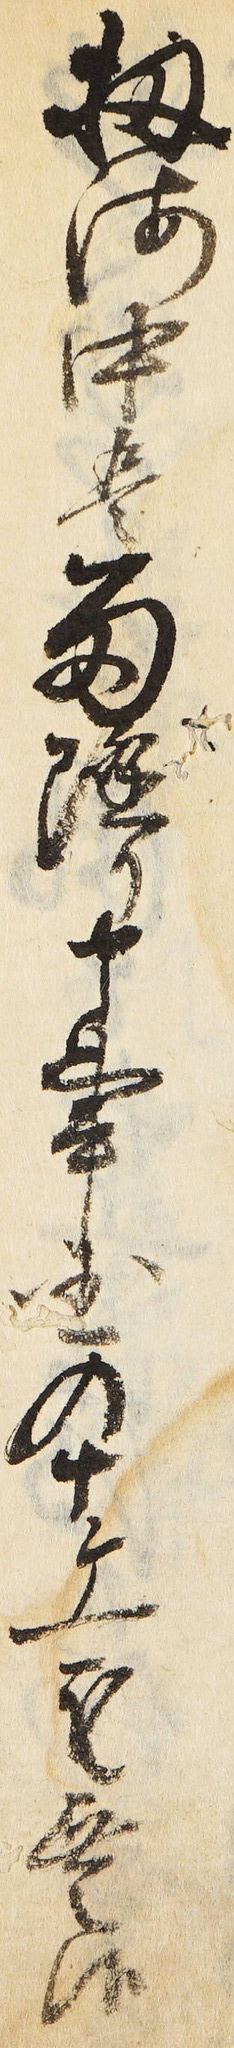扨海中は雨降り申事国の十ケ一も無之候
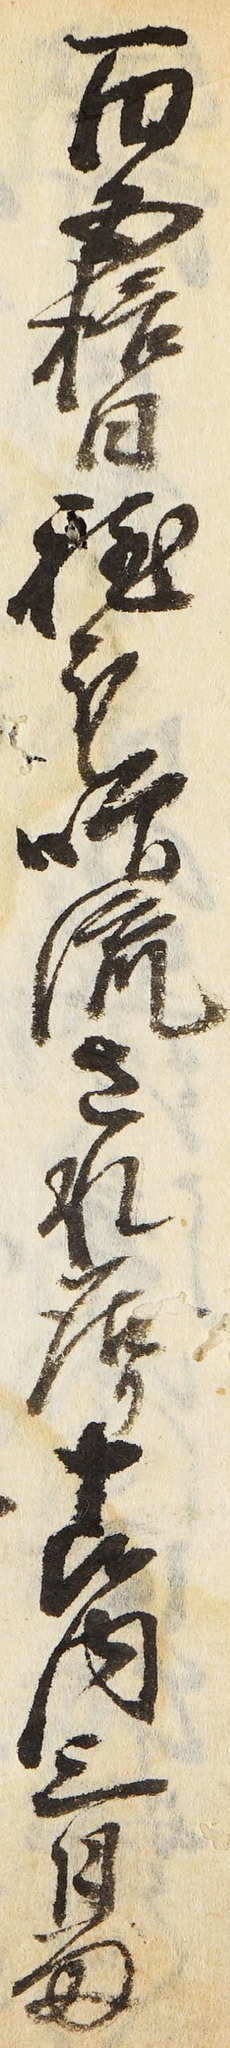百五拾日程も吹流され居り申候内三月雨
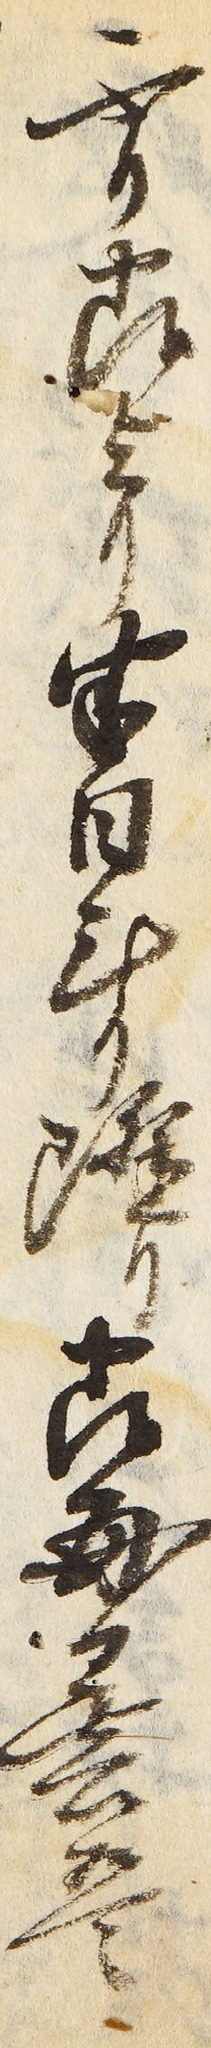ふり申候より半日計り降り申候毎日雲は
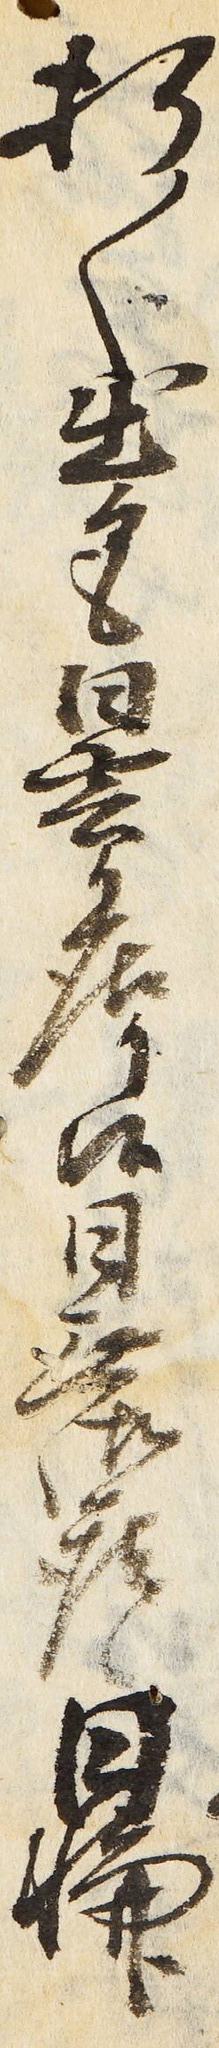折々出候も曇り居り候日無御座候日輪
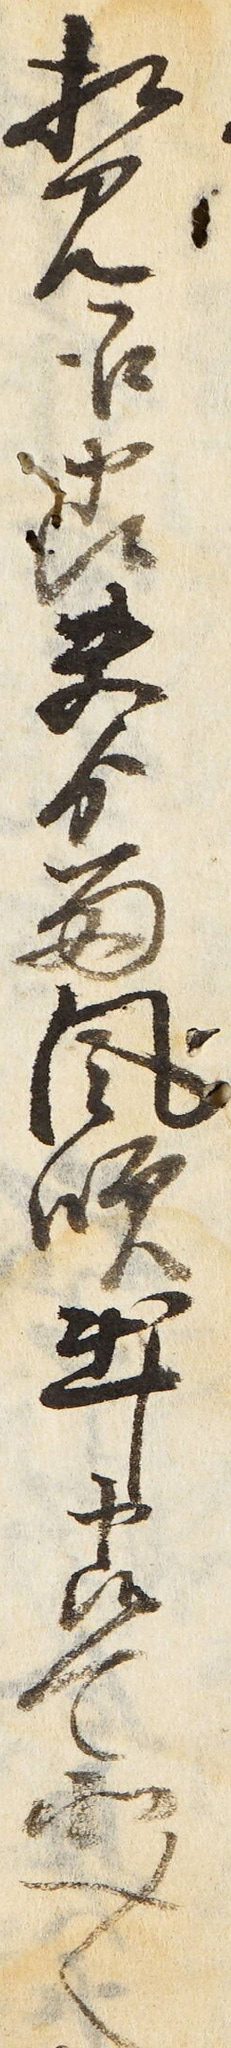相見江申候夫ゟ雨風吹出し申候て北へ〳〵
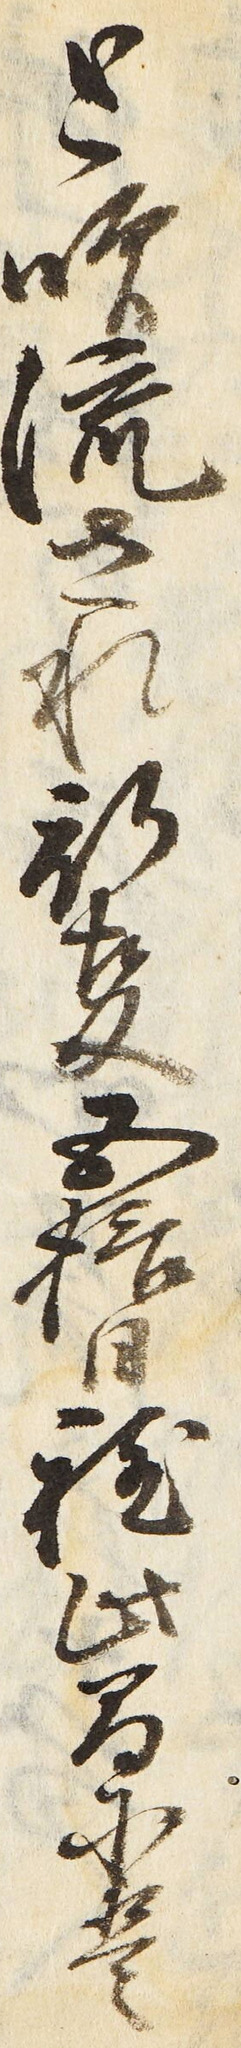と吹流され行事五拾日程此間には
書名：志州鳥羽船頭外国江吹流し候一件
